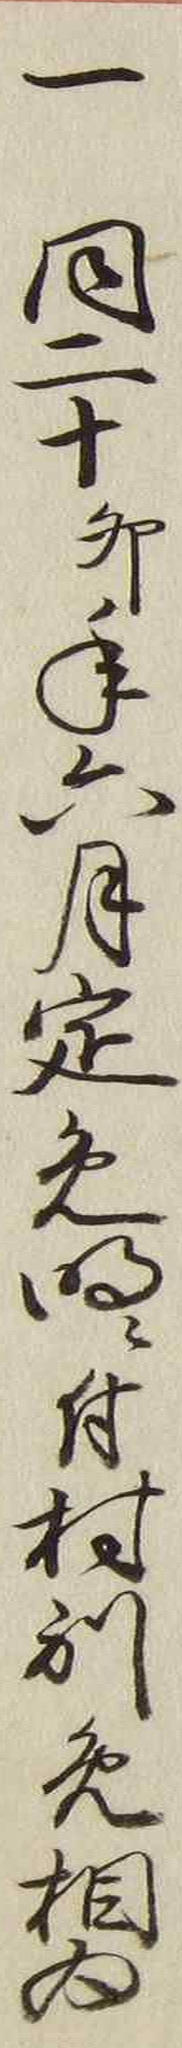一同二十卯年六月定免明ニ付村別免相為

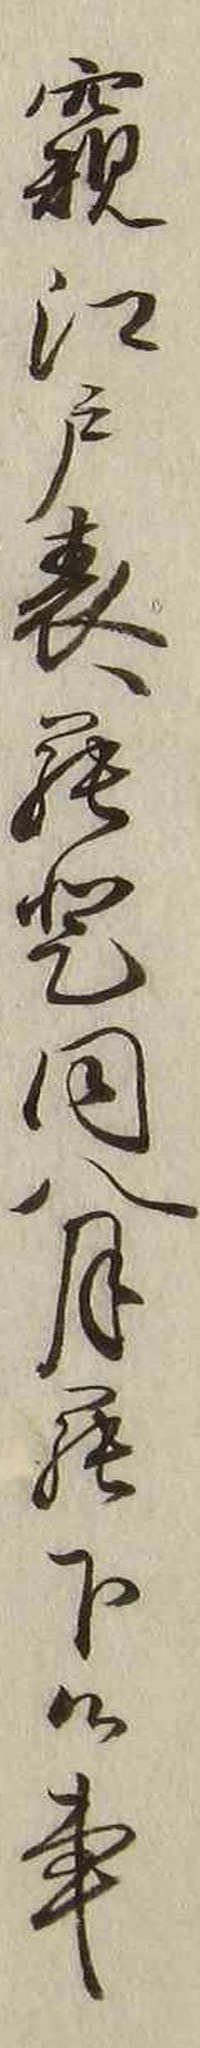窺江戸表へ罷登同八月罷下候事
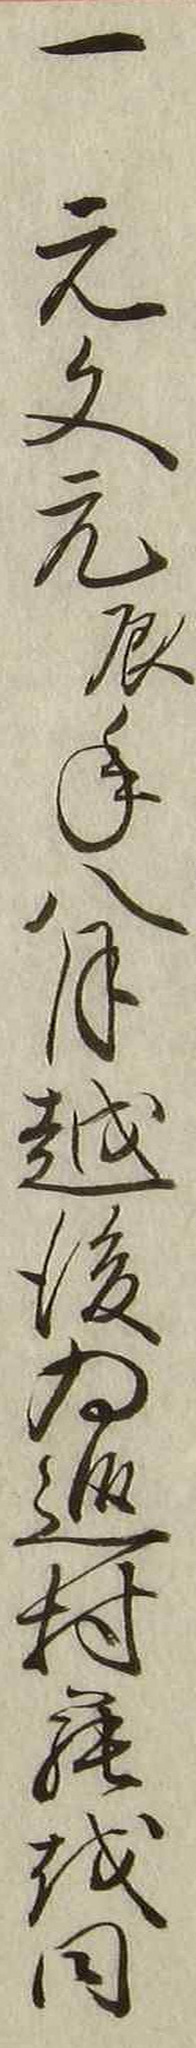一元文元辰年八月越後為巡村罷越同
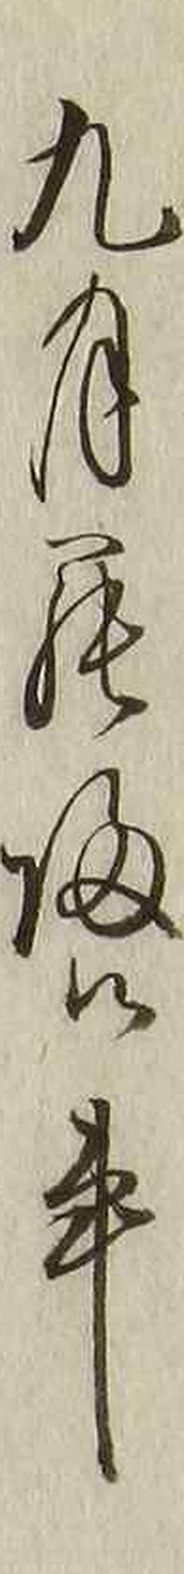九月罷帰事侯
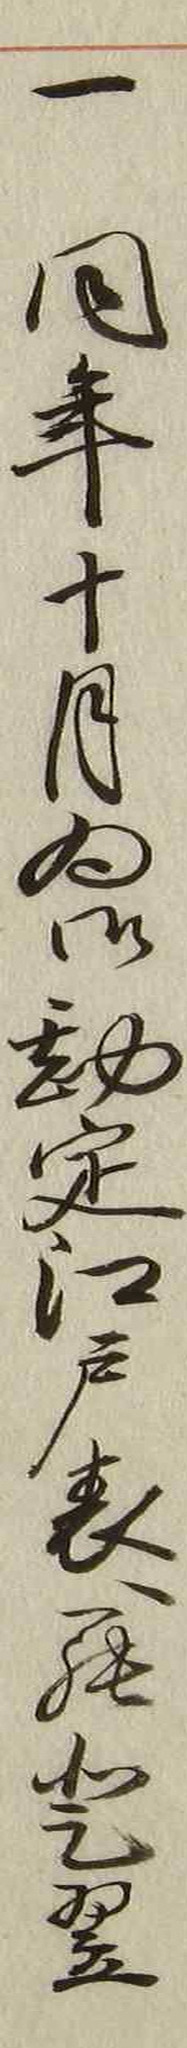一同年十月為御勘定江戸表へ罷登翌
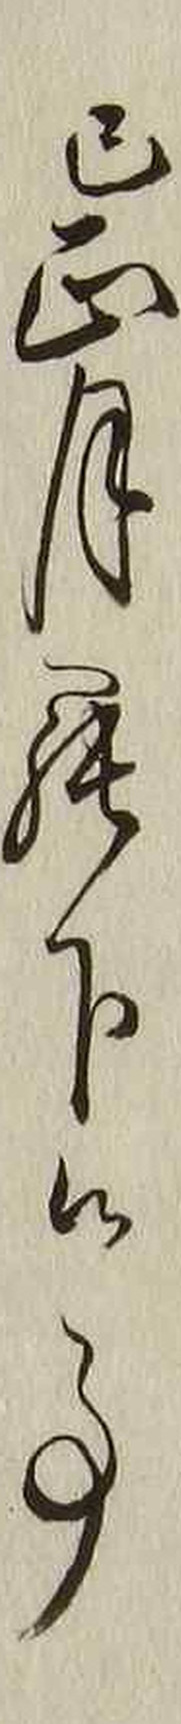巳正月罷下候事
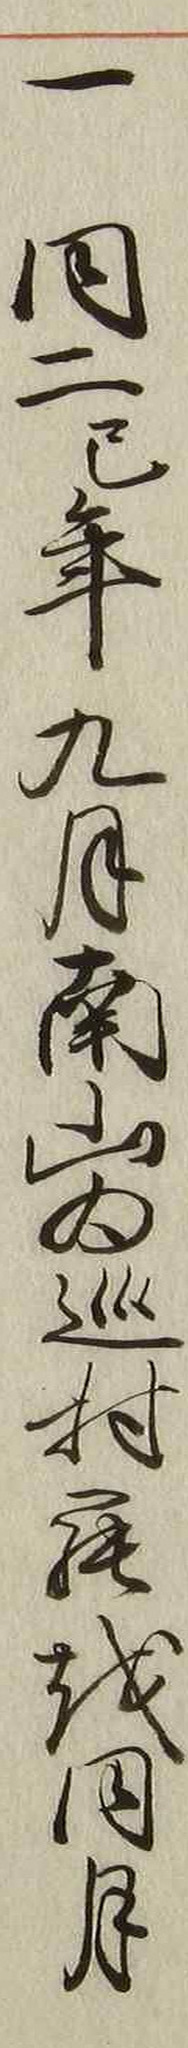一同二巳年九月南山為巡村罷越同月
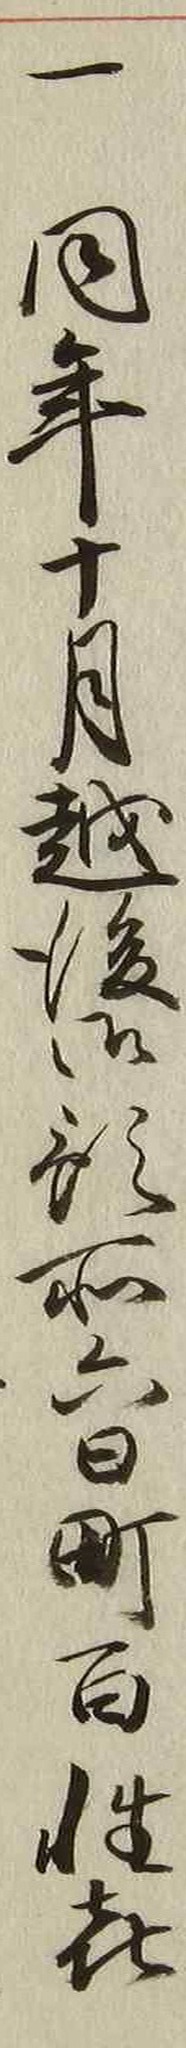一同年十月越後御預所六日町百性喜
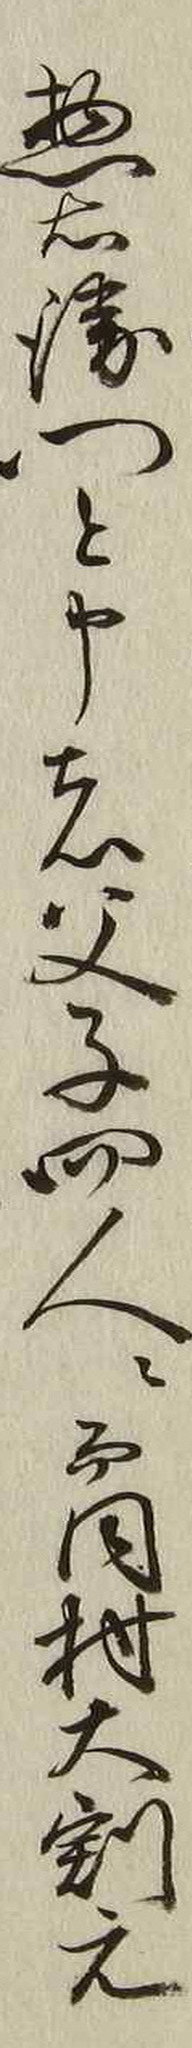惣右衛門と申者父子四人ニ而同村大割元
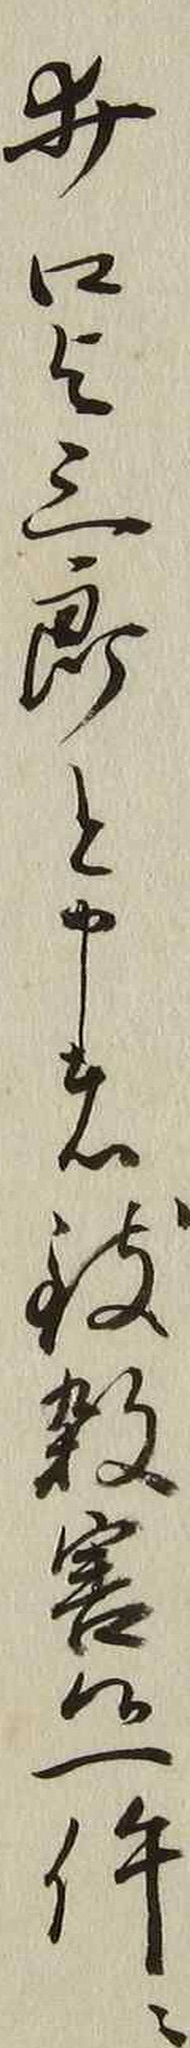井口与三郎と申者致殺害候一件ニ
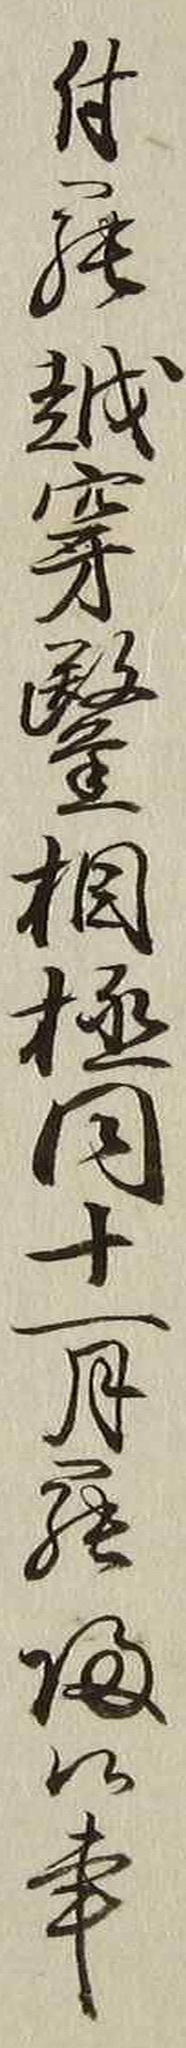付罷越穿鑿相極同十一月罷帰候事
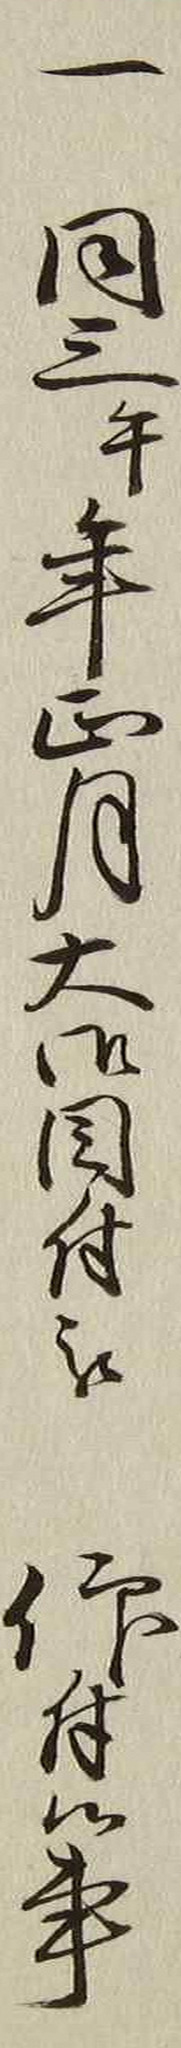一同三午年正月大御目付被仰付候事
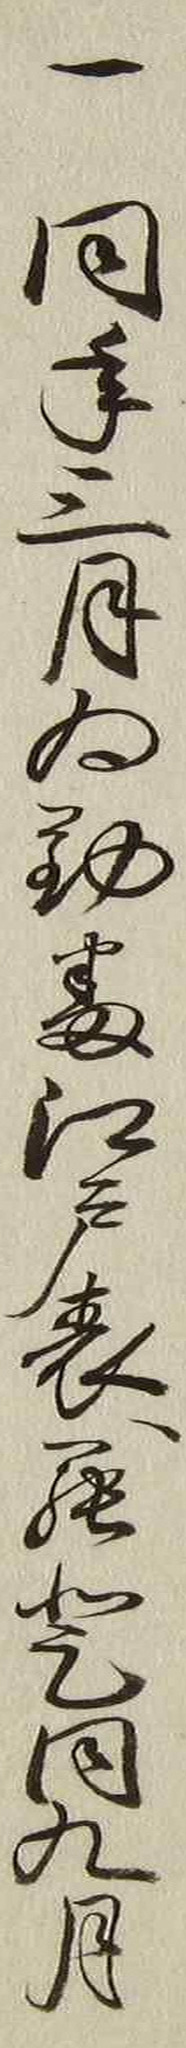一同年三月為勤番江戸表へ罷登同九月
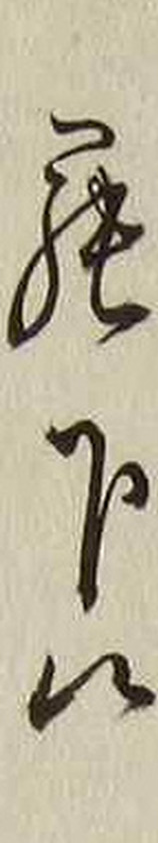罷下候
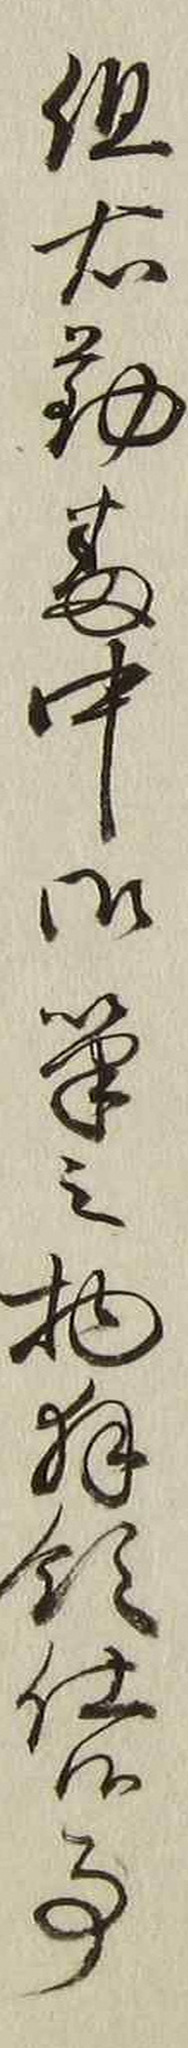但右勤番中御筆之物拝領仕候事
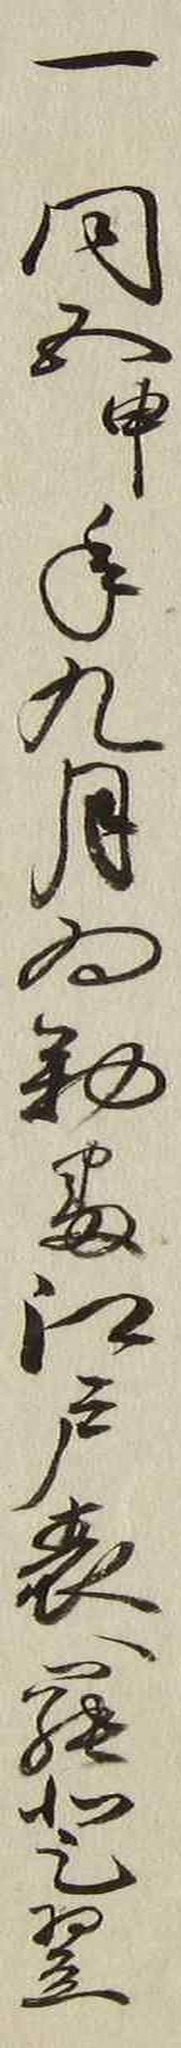一同五申年九月為勤番江戸表へ罷登翌
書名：諸士系譜　巻之21　い之部21
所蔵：会津若松市立会津図書館
